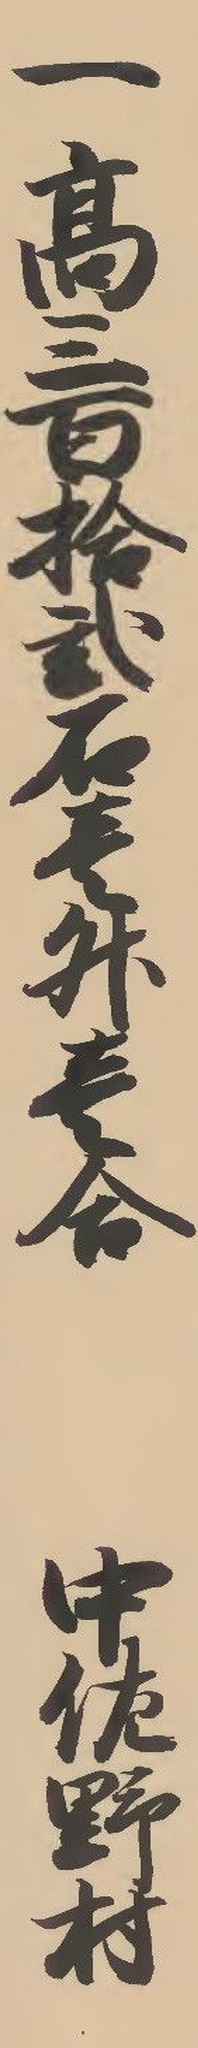一高三百拾弐石壱升壱合中佐野村
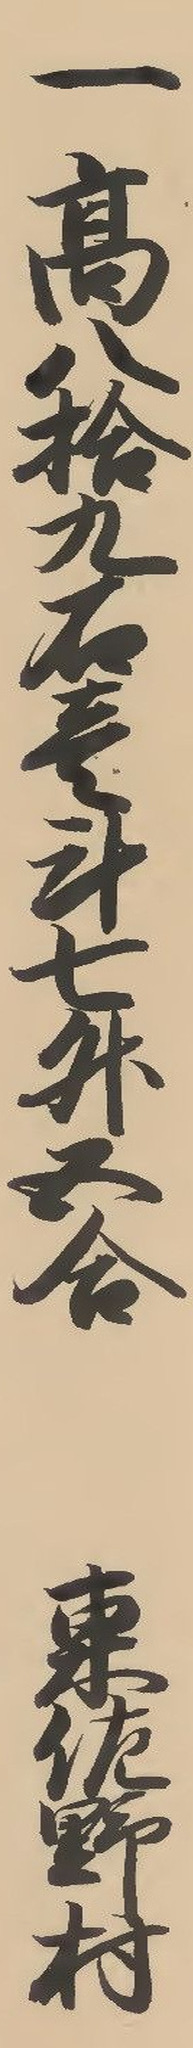一高八拾九石壱斗七升五合東佐野村
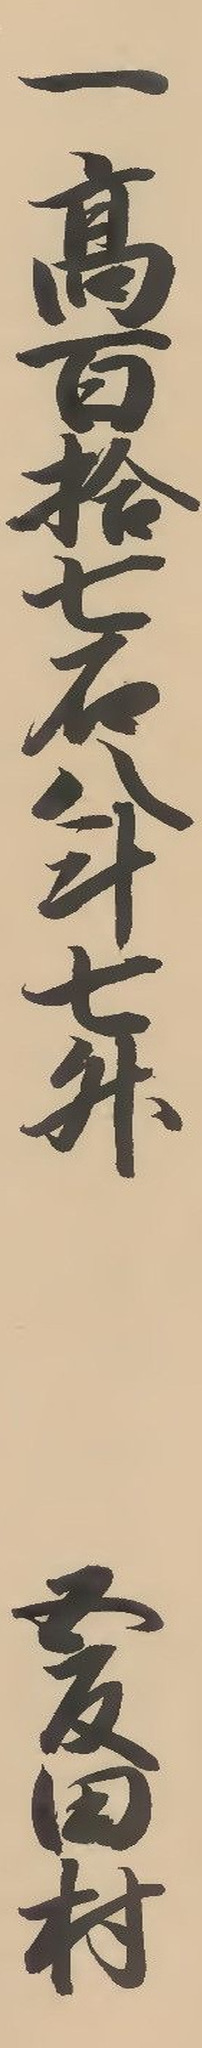一高百拾七石八斗七升五反田村
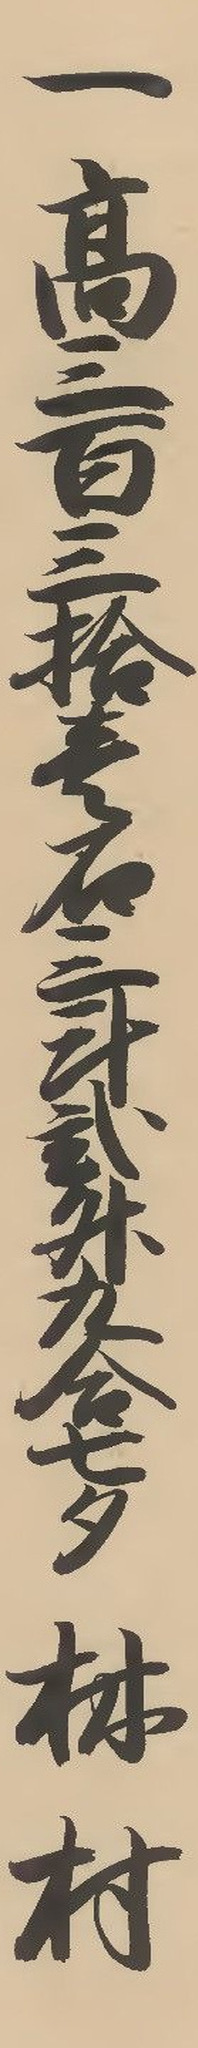一高三百三拾壱石三斗弐升九合七勺林村
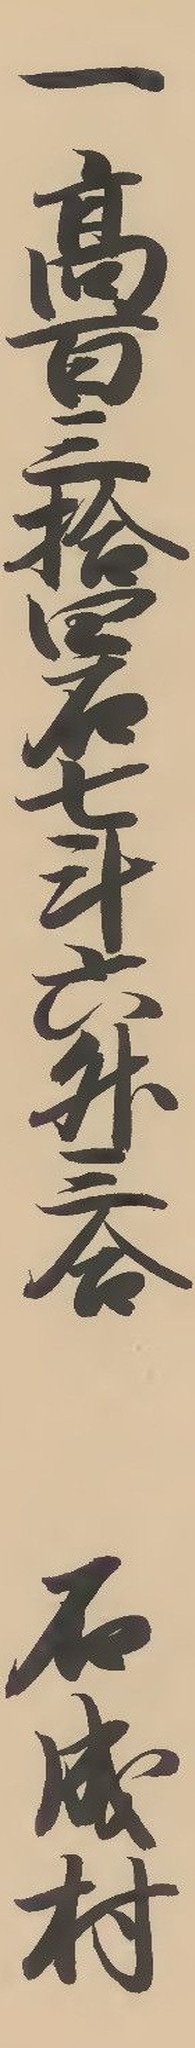一高百三拾四石七斗六升三合石成村

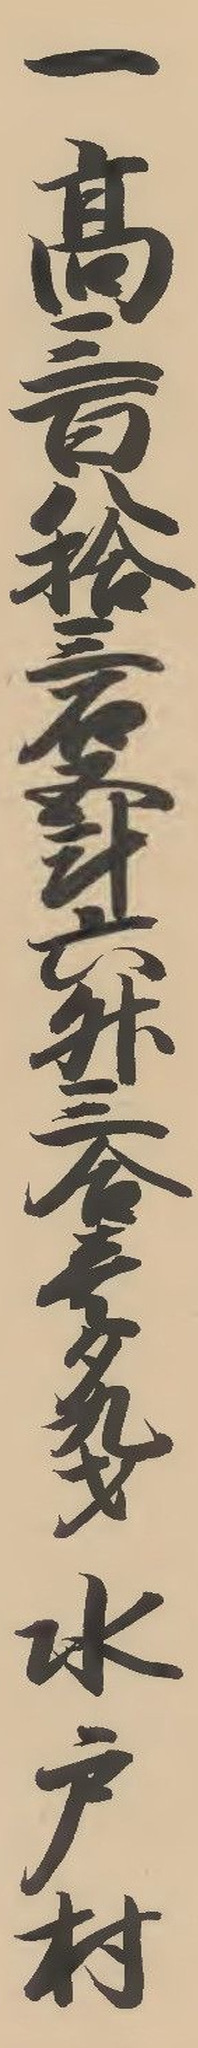一高三百八拾三石五斗六升三合壱勺九才水戸村
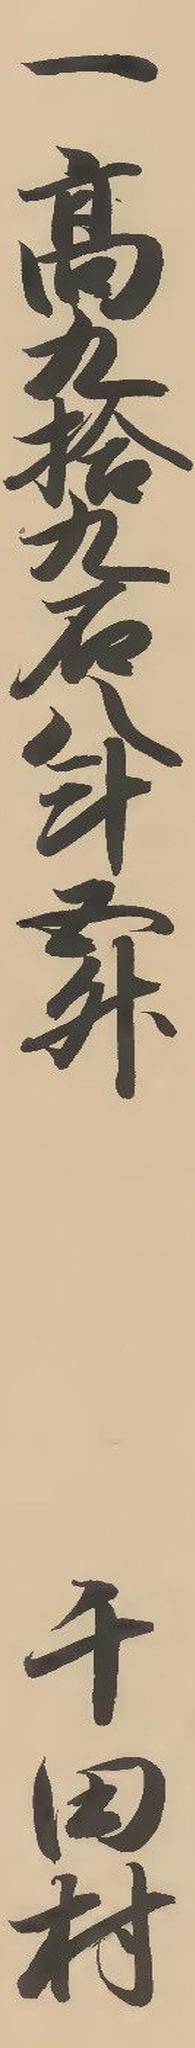一高九拾九石八斗五升千田村
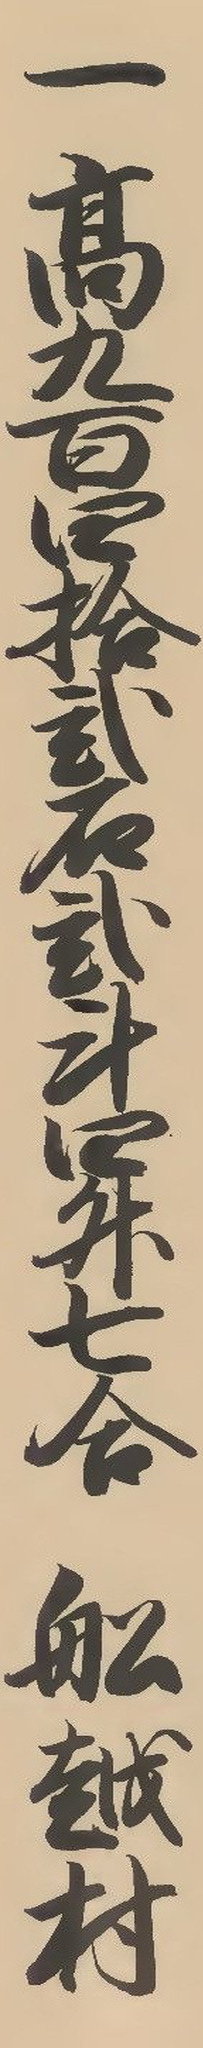一高九百四拾弐石弐斗四升七合船越村
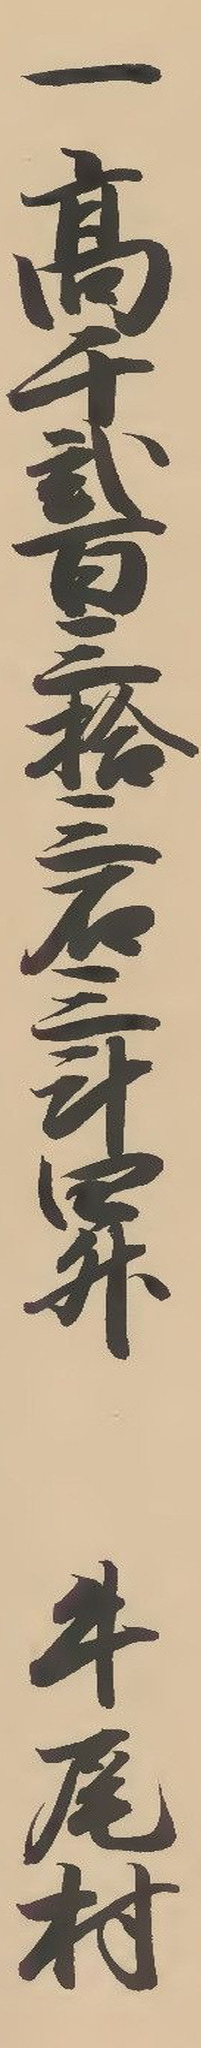一高千弐百三拾三石三斗四升牛尾村
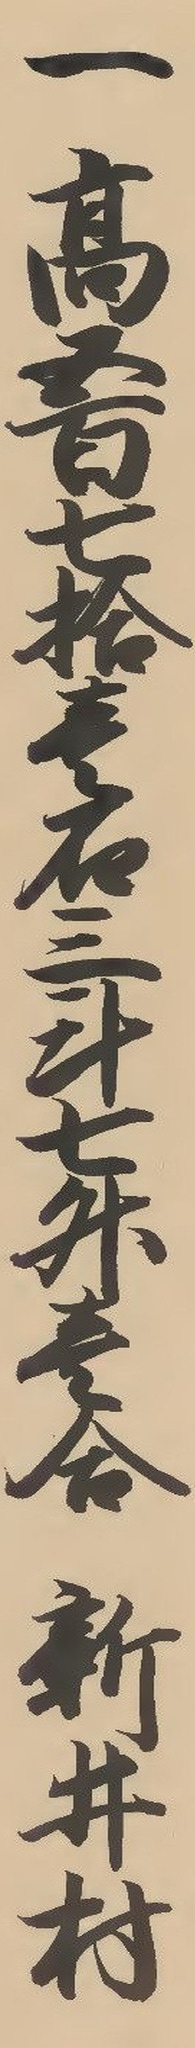一高五百七拾壱石三斗七升壱合新井村
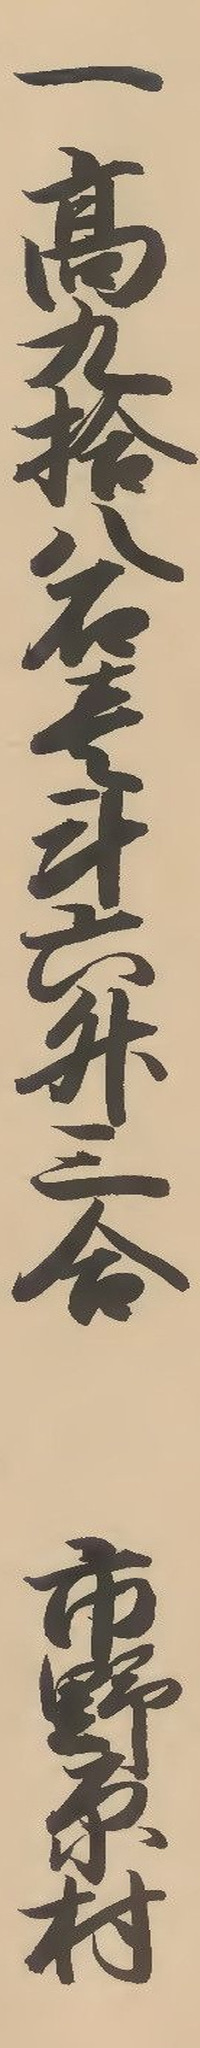一高九拾八石壱斗六升三合市野原村
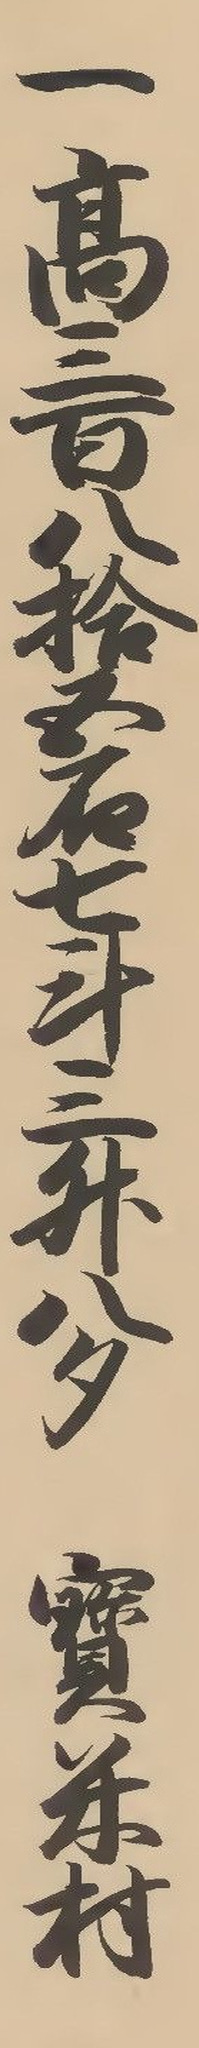一高三百八拾五石七斗三升八勺宝米村
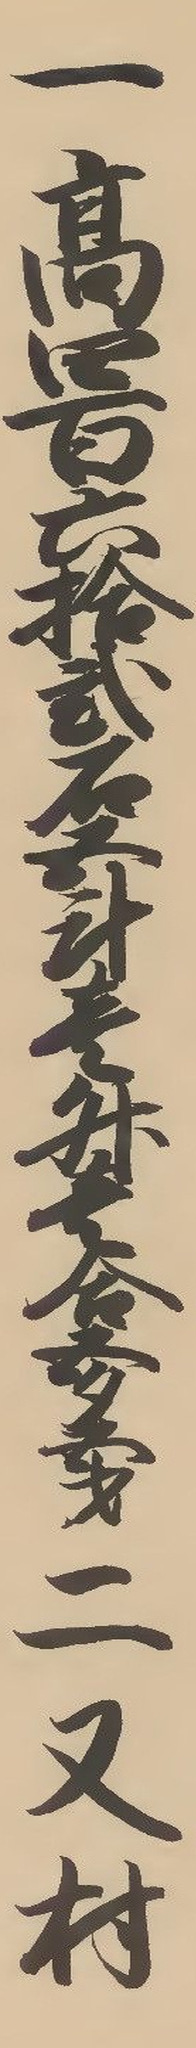一高四百六拾弐石五斗壱升壱合五勺五才二又村

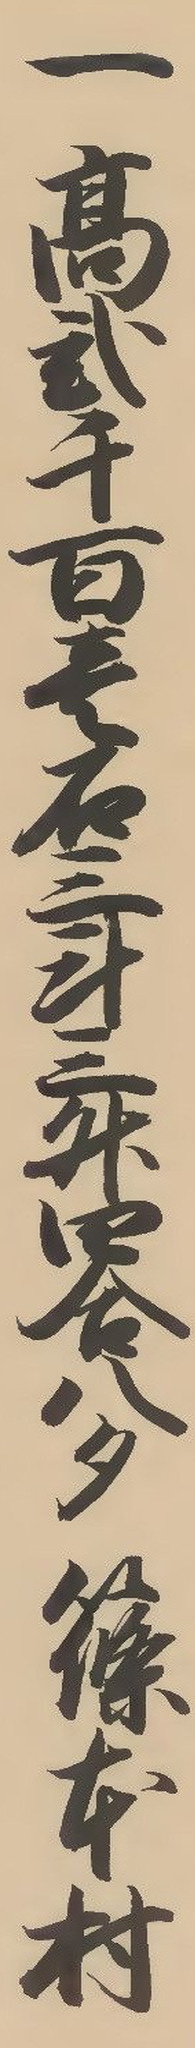一高弐千百壱石三斗三升四合八勺篠本村
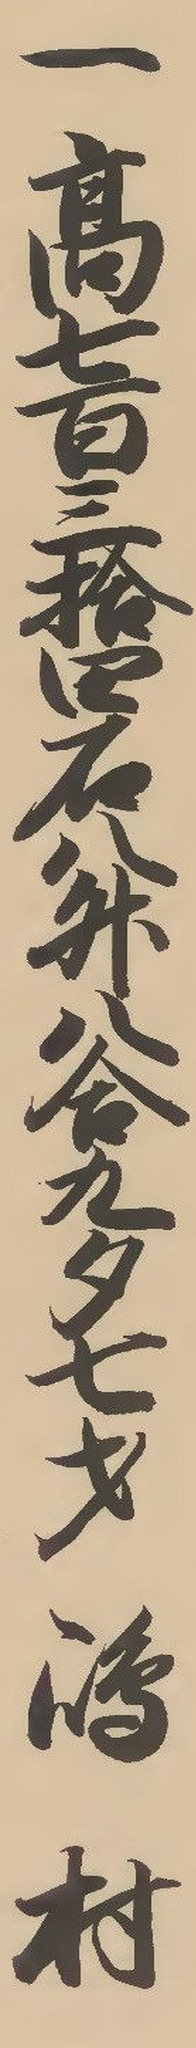一高七百三拾四石八升八合九勺七才島村
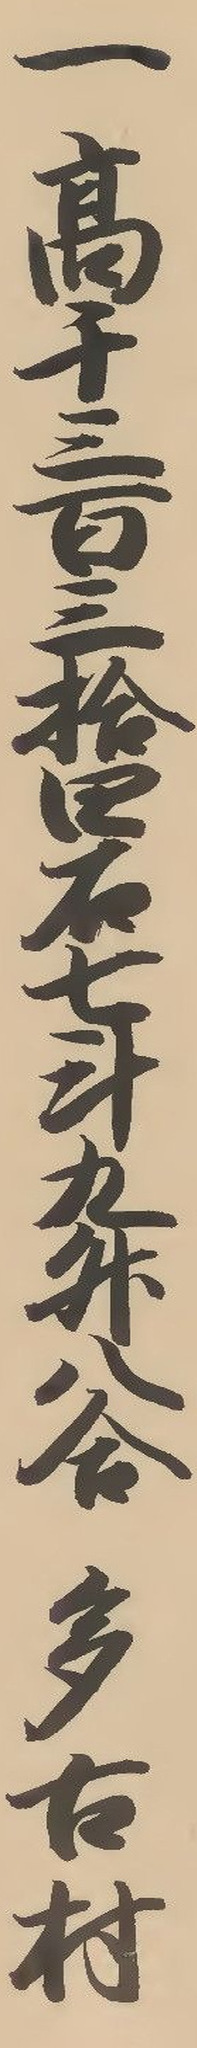一高千三百三拾四石七斗九升八合多古村
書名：下総国郷帳
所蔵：国立公文書館 National Archives of Japan
